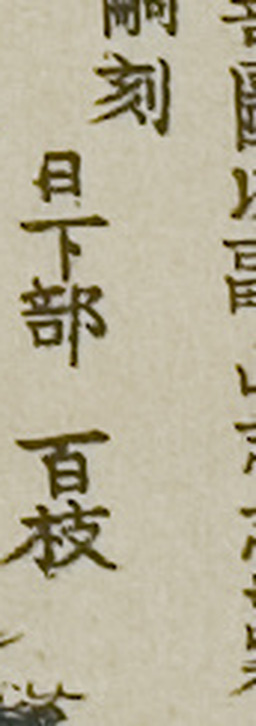日下部百枝
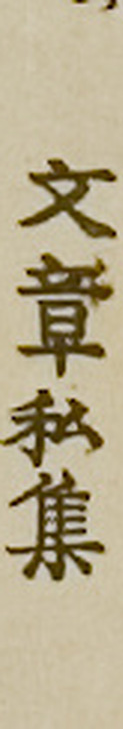文章私集
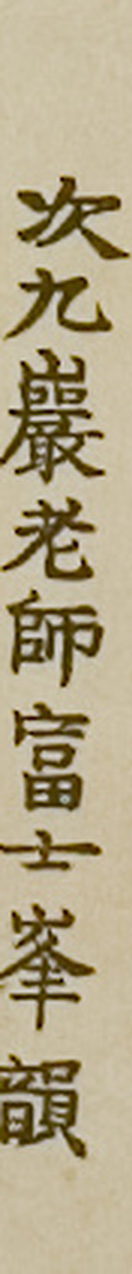次九巌老師富士峯韻
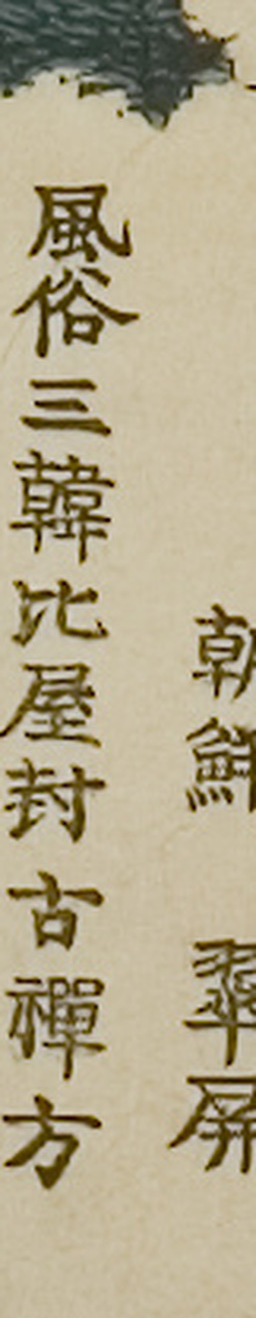風俗三韓比屋封古禅方
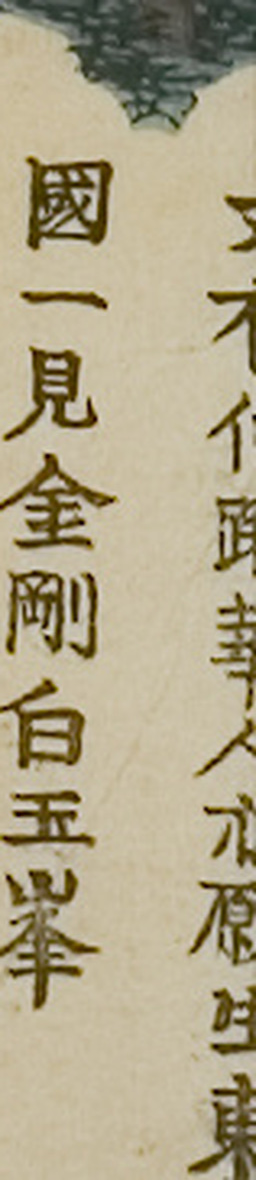国一見金剛白玉峯
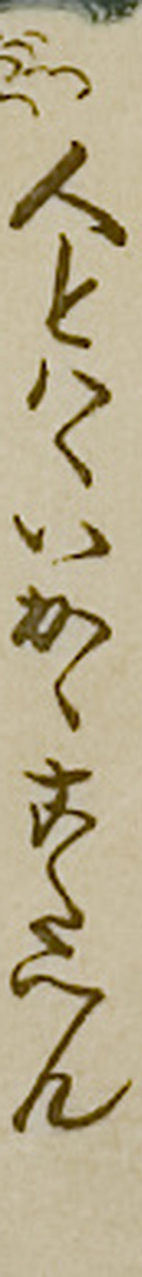人とはくいかゝつたへん
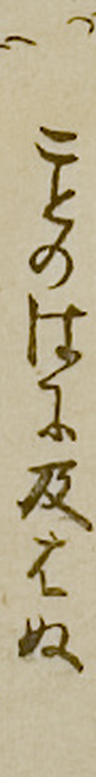ことのはに及はぬ
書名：[富士山図]
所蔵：東京大学総合図書館 General Library in the University of Tokyo, JAPAN
